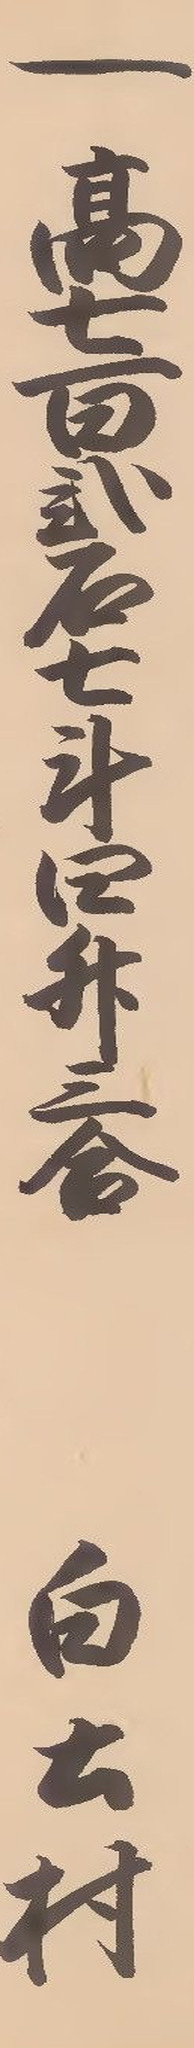一髙七百弐石七斗四升三合白土村
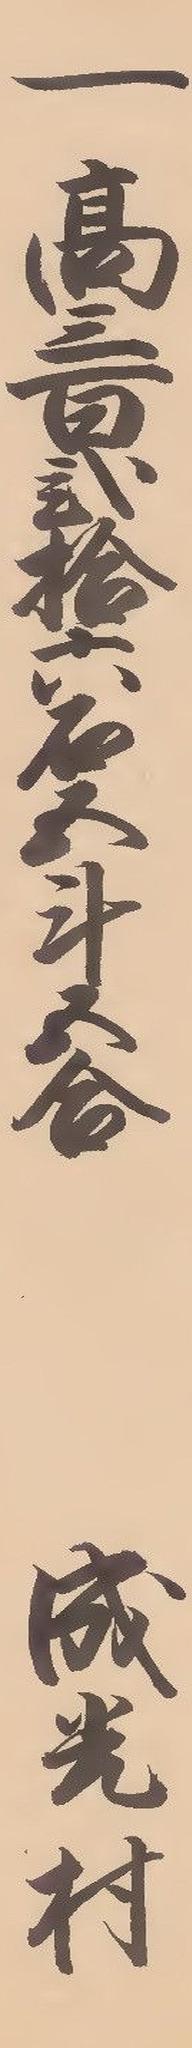一髙三百弐拾六石五斗五合成光村
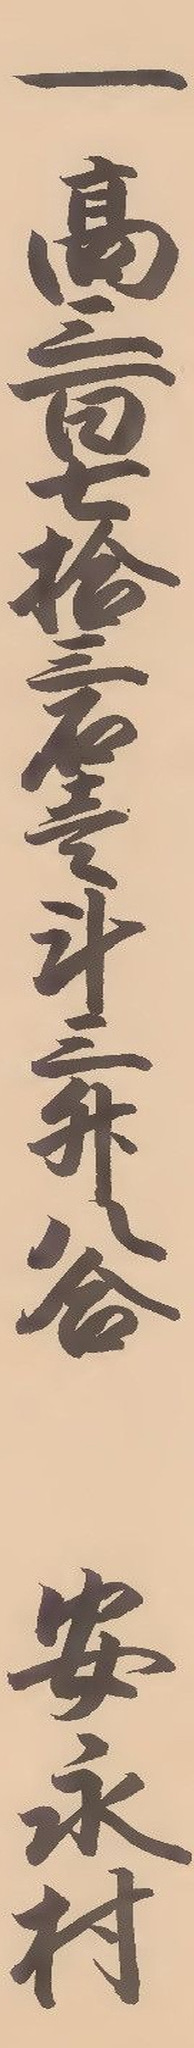一髙三百七拾三石壱斗三升八合安永村
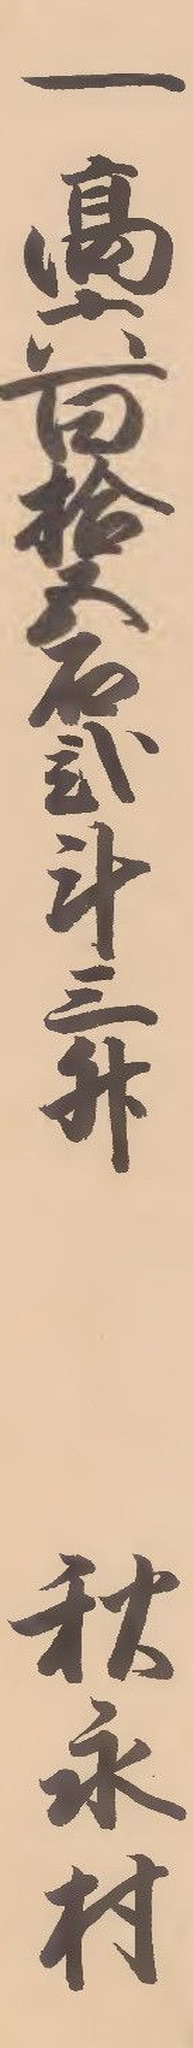一髙六百拾五石弐斗三升秋永村

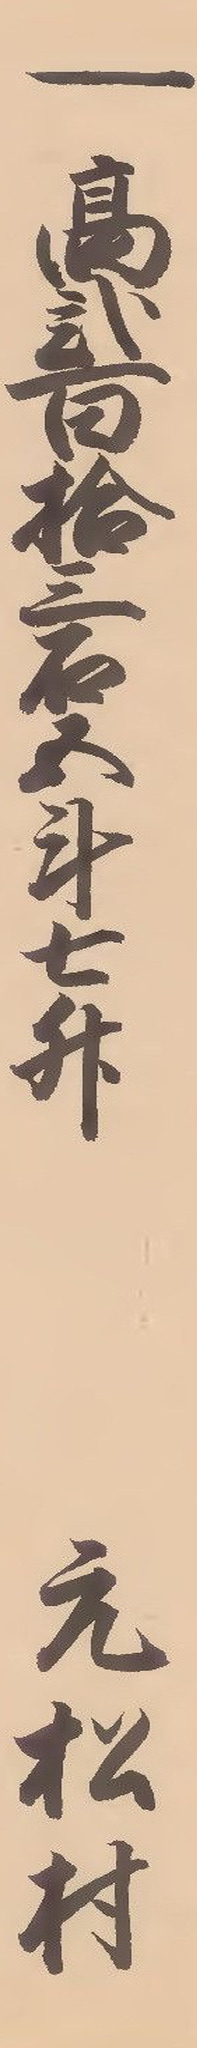一髙弐百拾三石五斗七升元松村
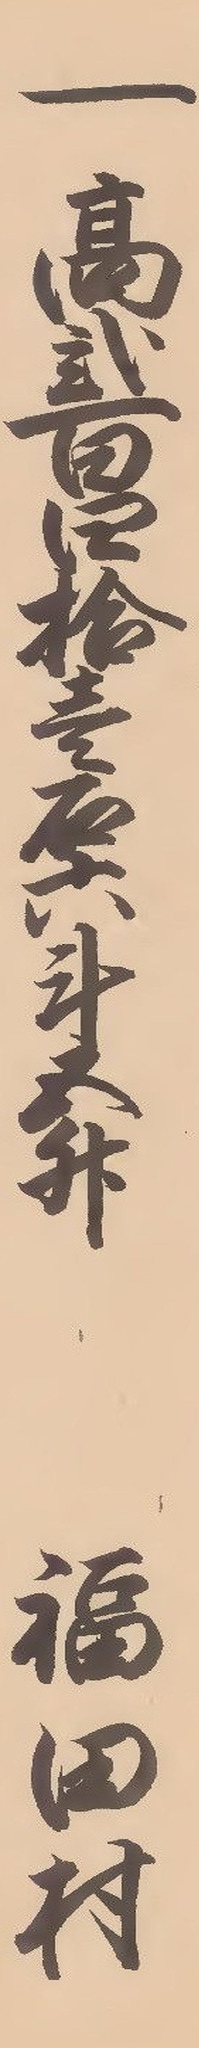一髙弐百四拾壱石六斗五升福田村
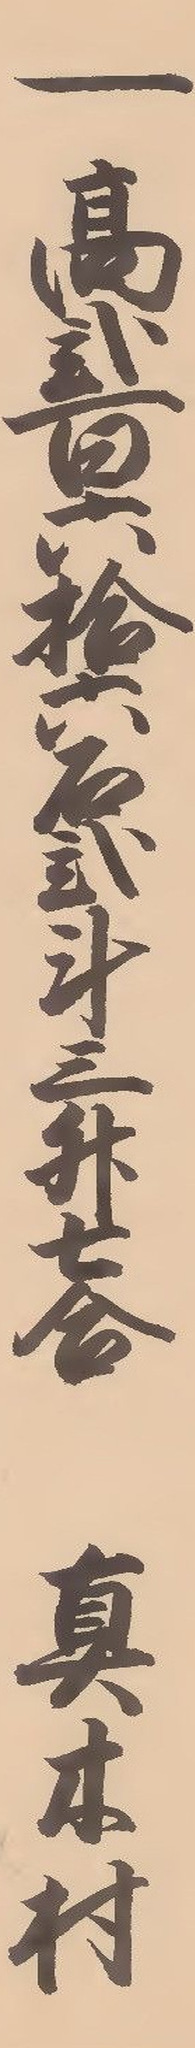一髙弐百六拾六石弐斗三升七合真木村
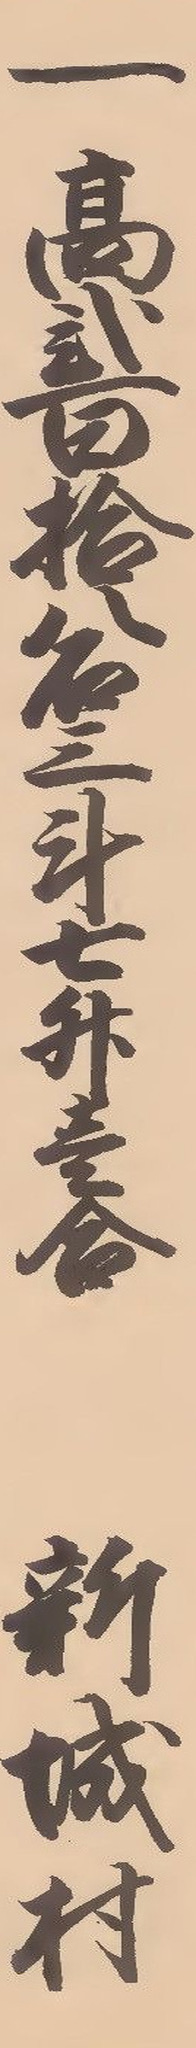一髙弐百拾八石三斗七升壱合新城村
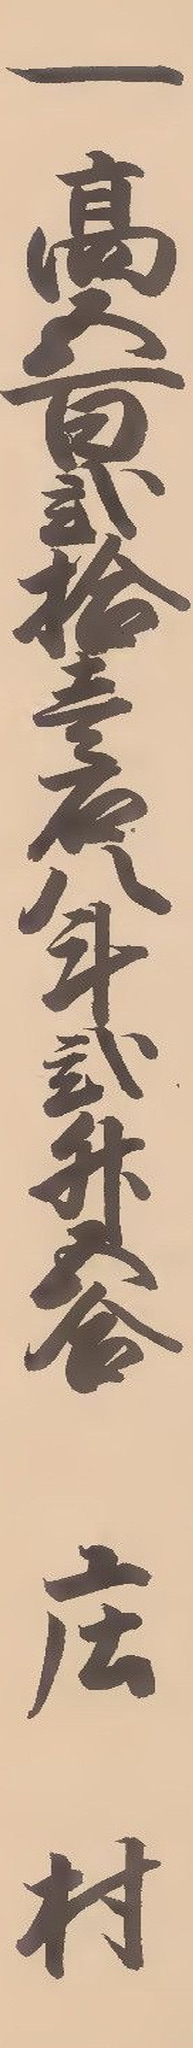一髙五百弐拾壱石八斗弐升五合庄村
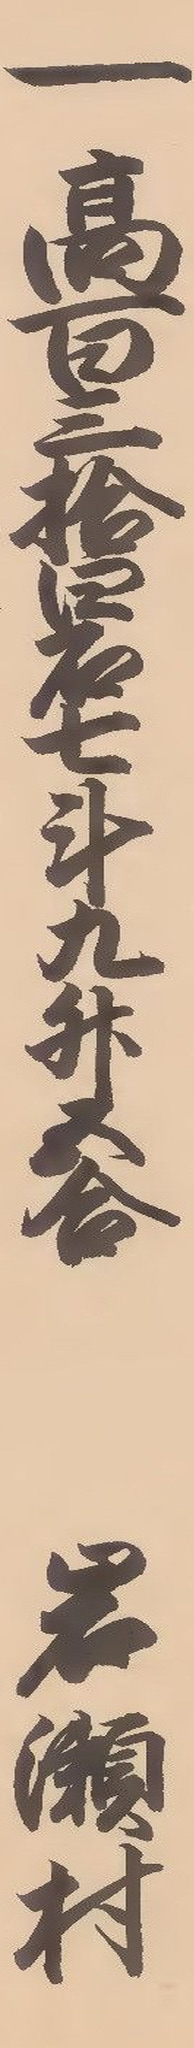一髙百三拾四石七斗九升五合岩瀬村
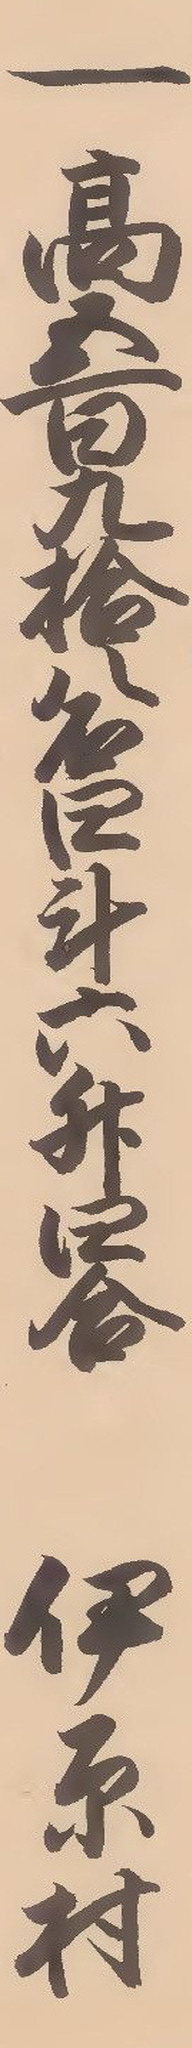一髙五百九拾八石四斗六升四合伊原村
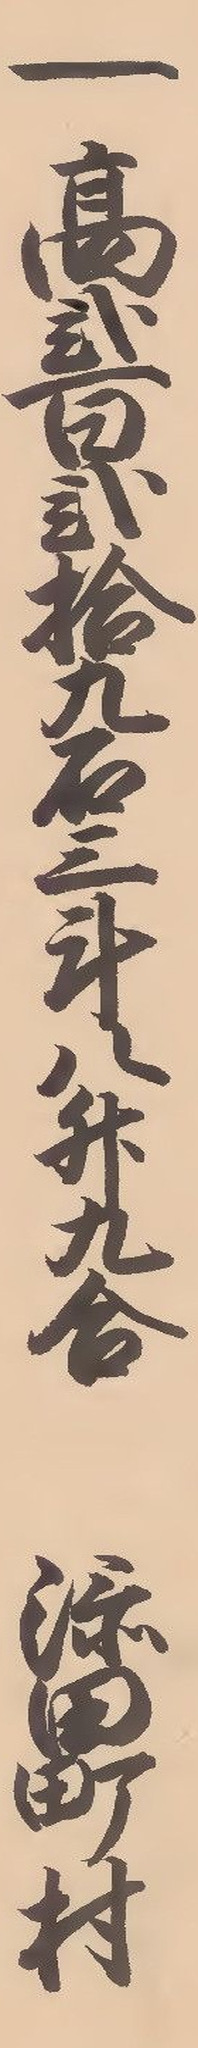一髙弐百弐拾九石三斗八升九合添田町村

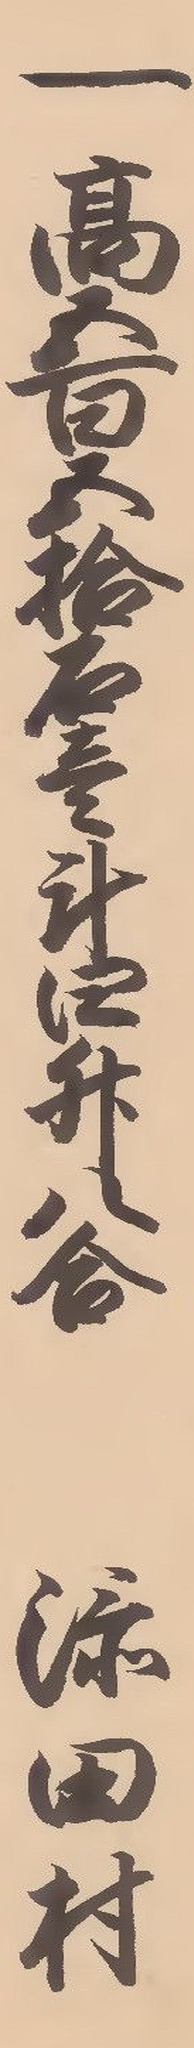一髙五百五拾石壱斗四升八合添田村
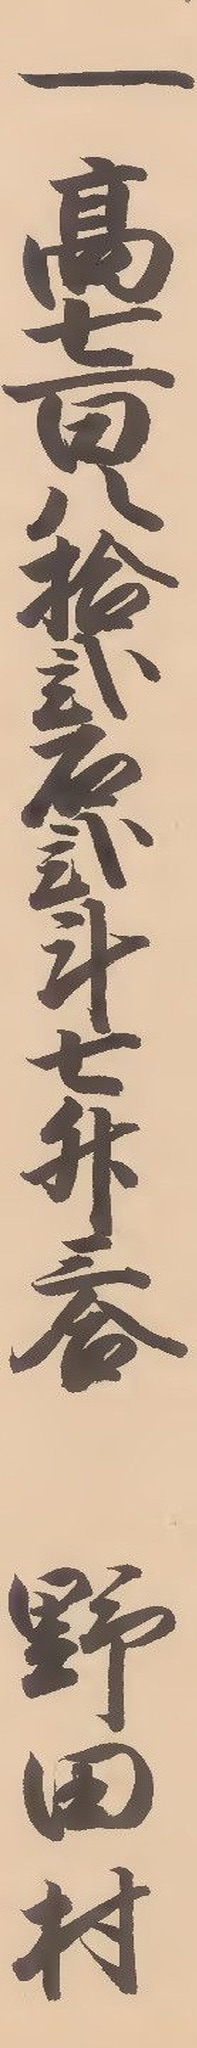一髙七百八拾弐石弐斗七升三合野田村
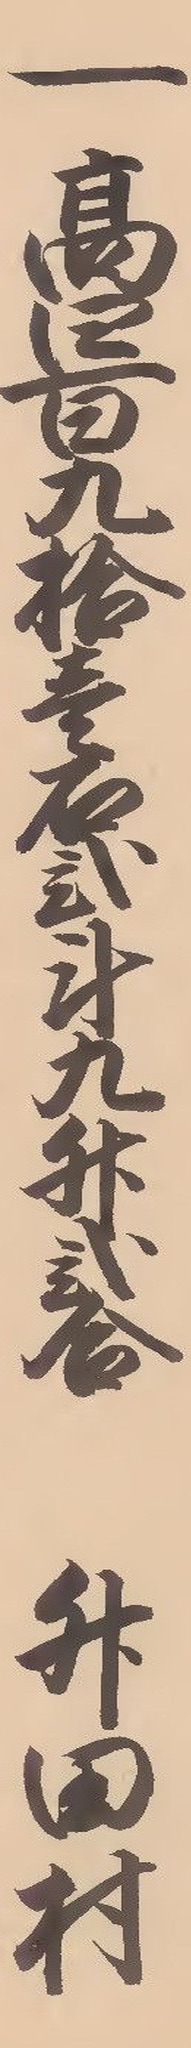一髙四百九拾壱石弐斗九升弐合升田村
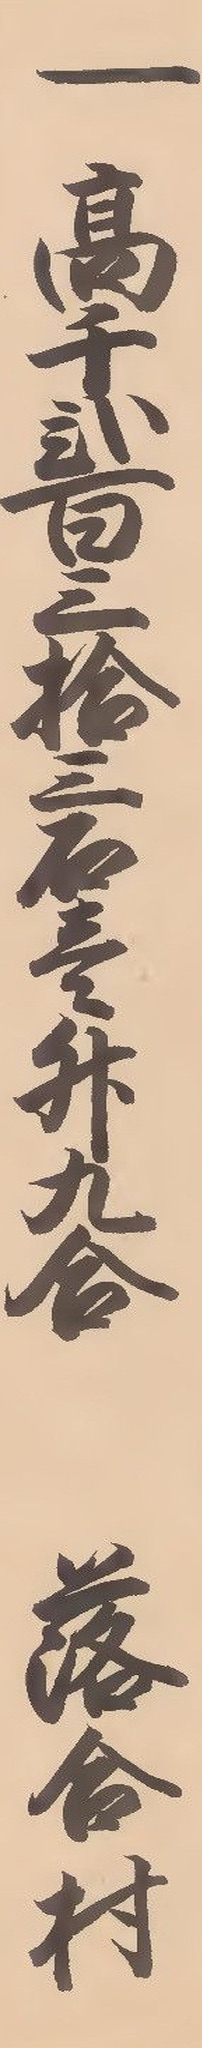一髙千弐百三拾三石壱升九合落合村
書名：豊前国郷帳
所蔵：国立公文書館 National Archives of Japan
